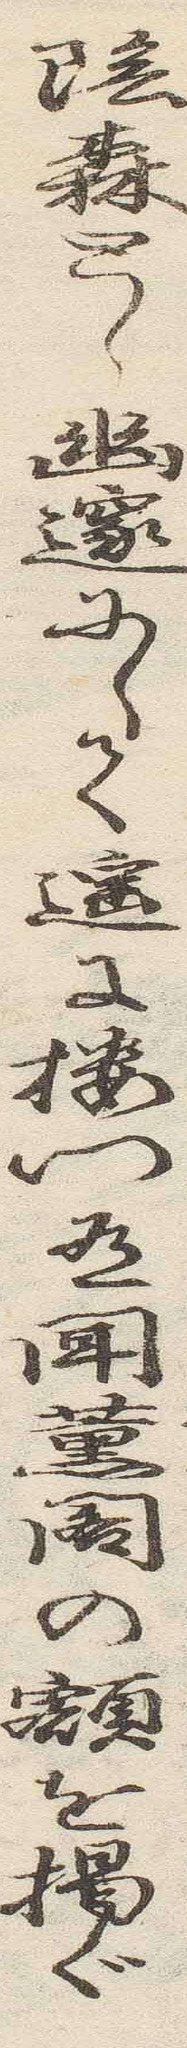陰森とし幽邃にして遥に楼門有聞薫閣の額を掲ぐ座主の
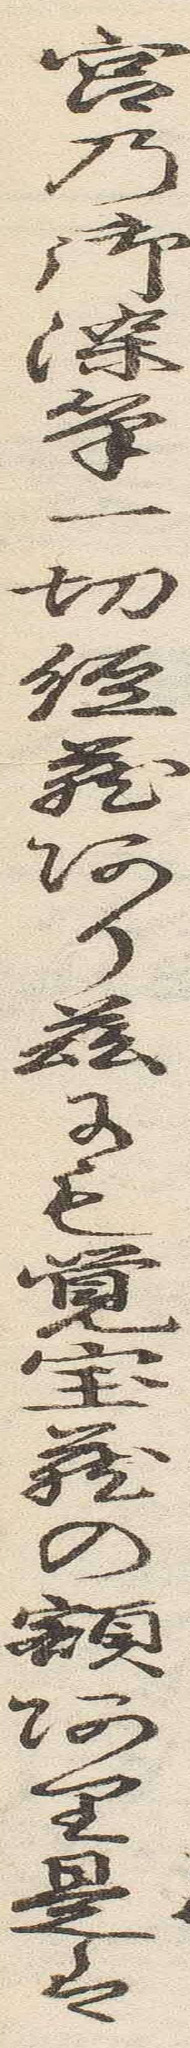宮の御染筆一切經蔵あり兹にも覚宝蔵の額あり是は
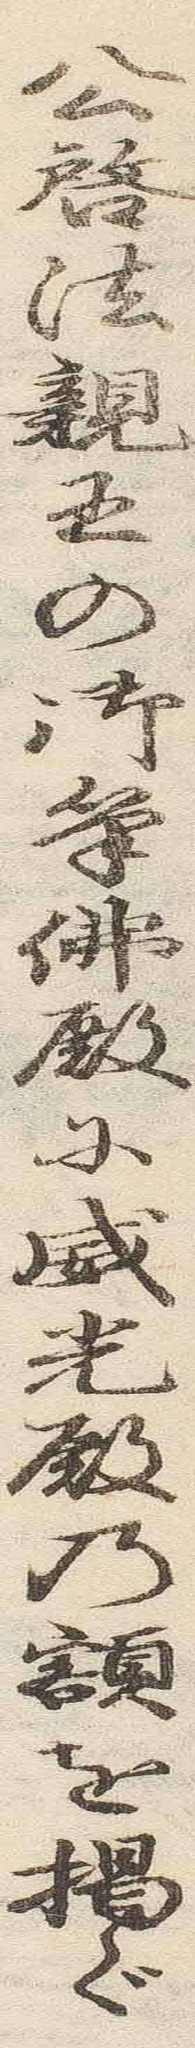公啓法親王の御筆佛殿に威光殿の額を掲ぐ
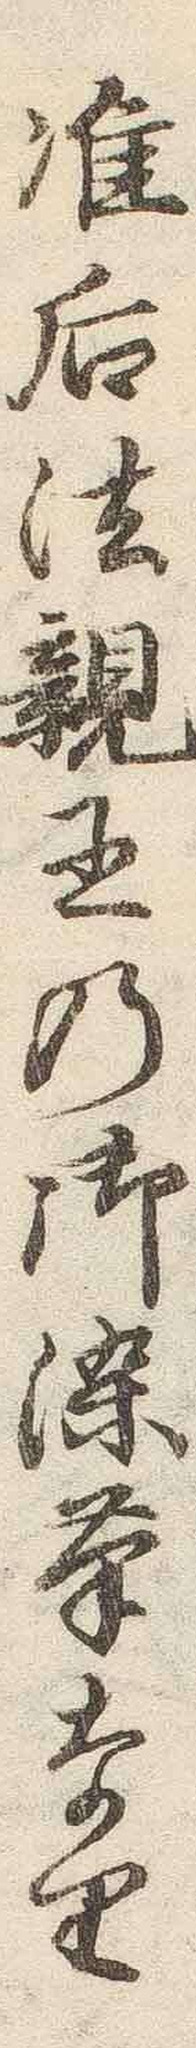准后法親王の御染筆なり
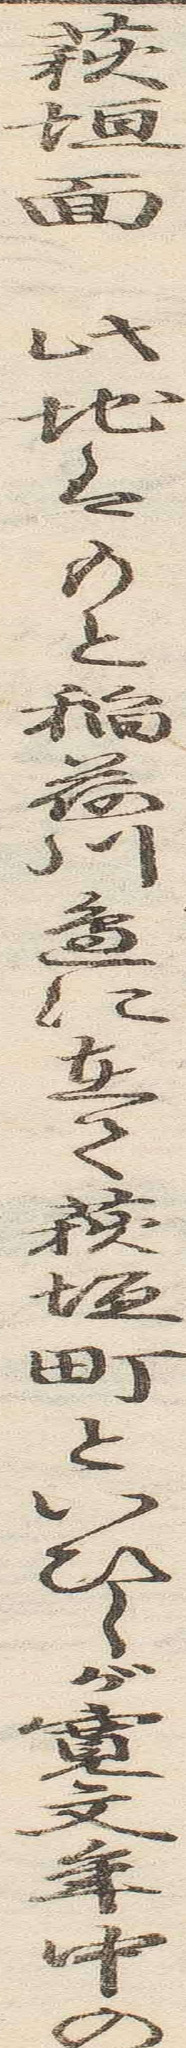萩垣面此地はもと稲荷川邊に在て萩垣町といひしが寛文年中の
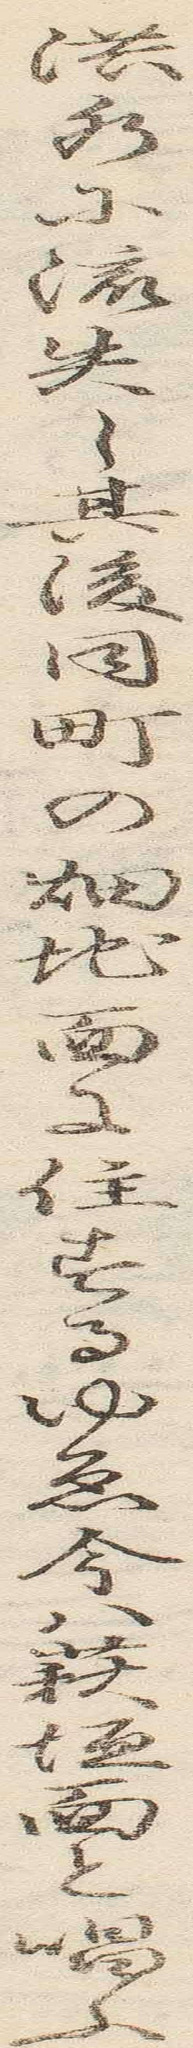洪水に流失し其後同町の畑地面に住するゆゑ今は萩垣面と唱ふ
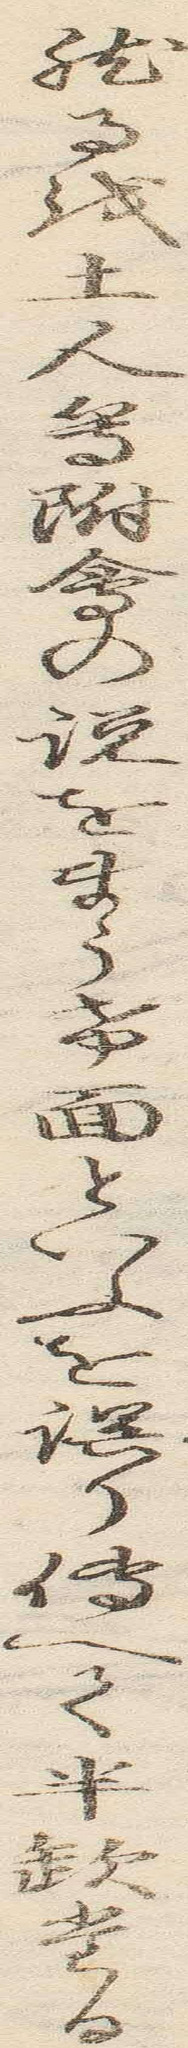然るを土人等附會の説をまうけ面といふを誤り傳へて半缺たる
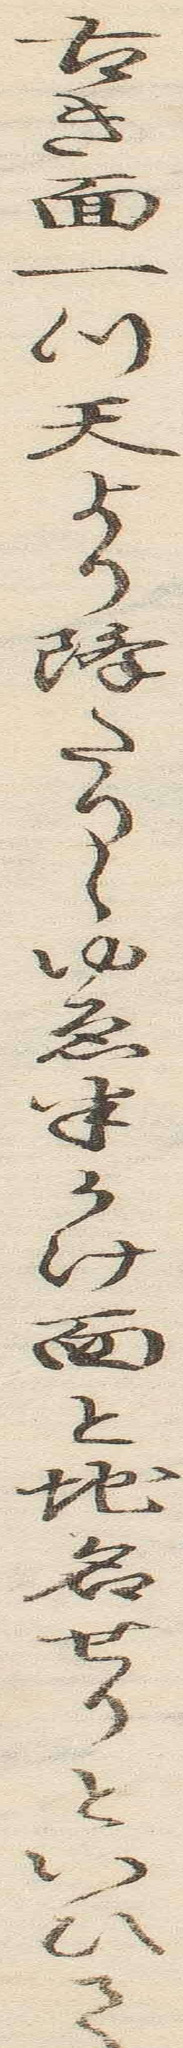古き面一つ天より降たりしゆゑ半かけ面と地名せりといひて
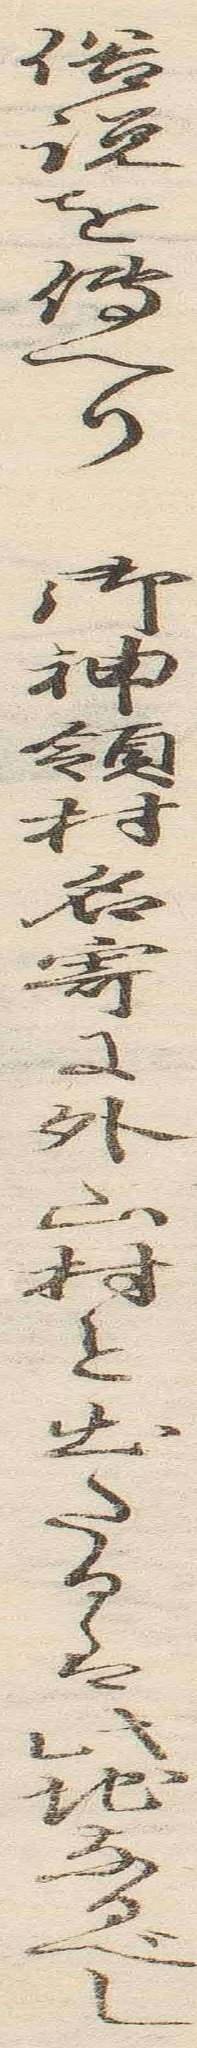俗説を傳へり御神領村名寄に外山村と出たるは此地なるべし
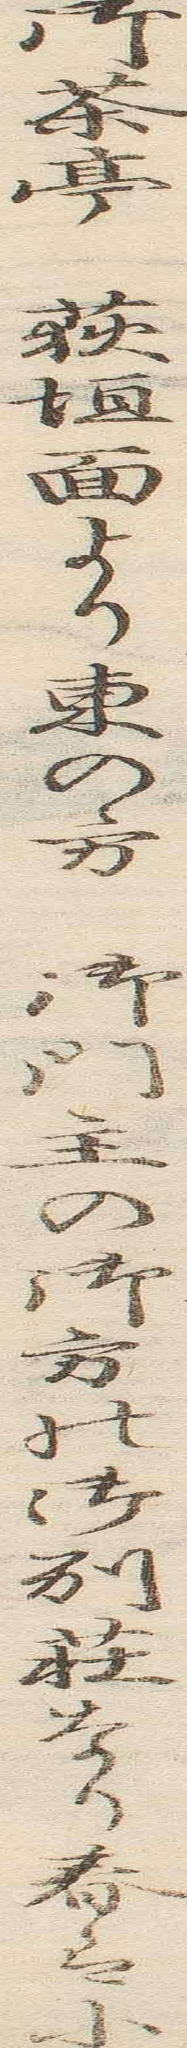御茶亭萩垣面より東の方御門主の御方の御別荘なり春は小
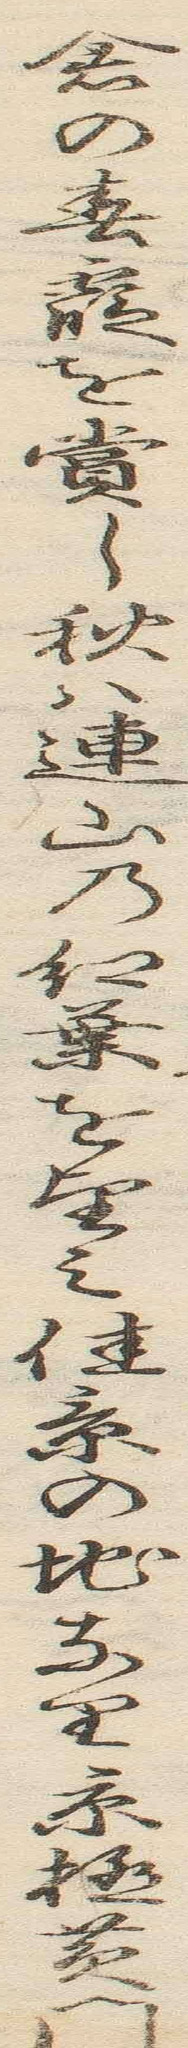倉の春霞を賞し秋は連山の紅葉を望み佳景の地なり京極黄門
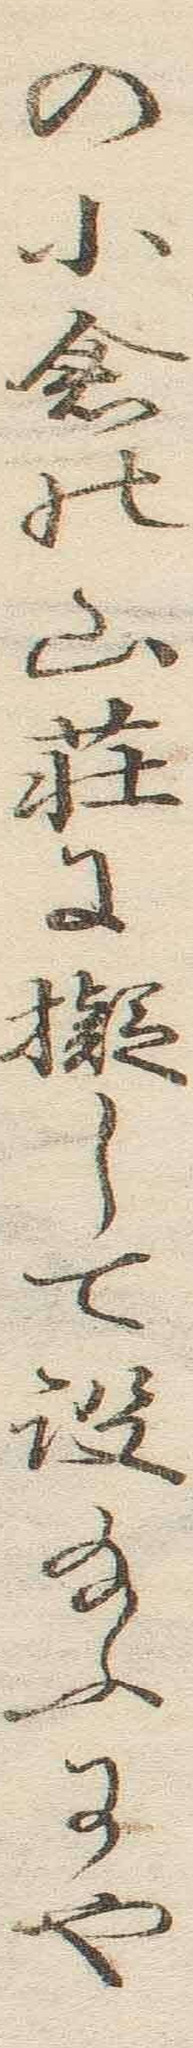の小倉の山荘に擬して設給ふにや
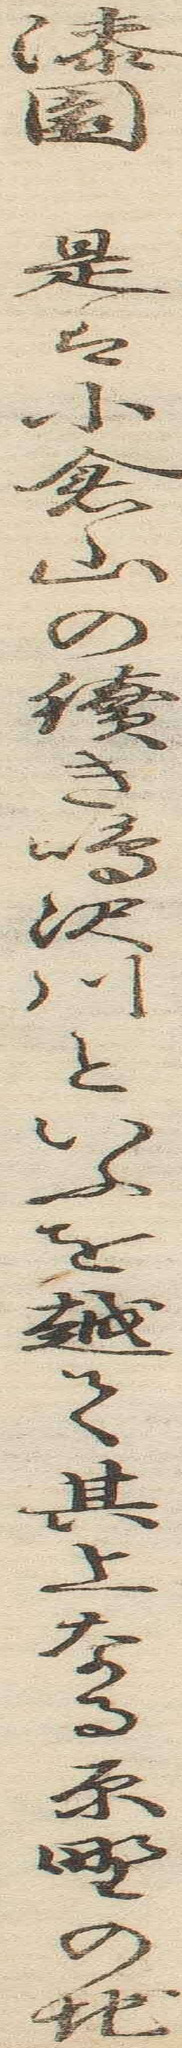漆園是は小倉山の續き鳴沢川といふを越て其上なる原㙒の地
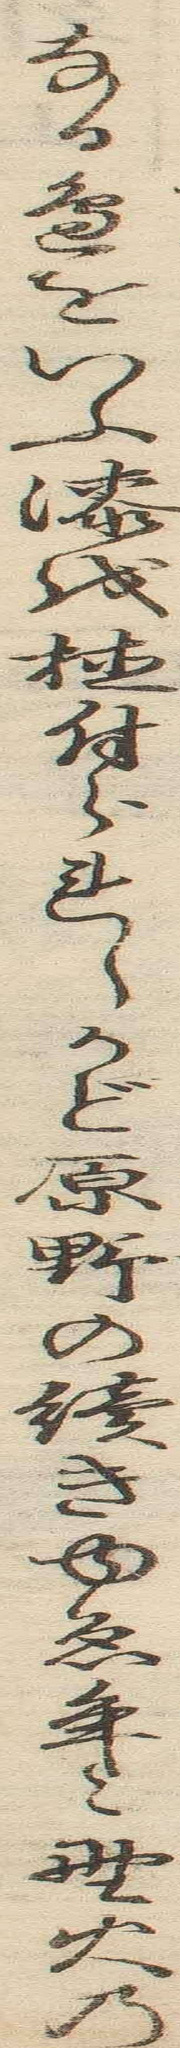なる邊をいふ漆を植付られしかど原㙒の續きゆゑ年〻㙒火の

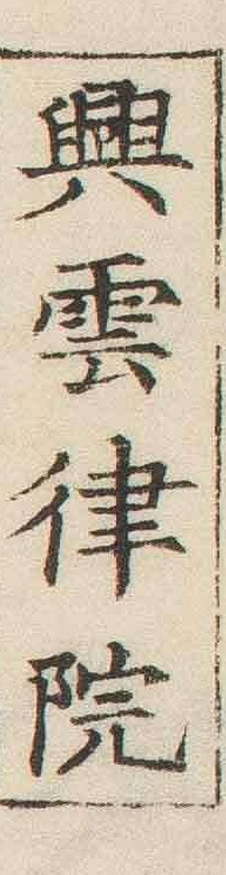興雲律院

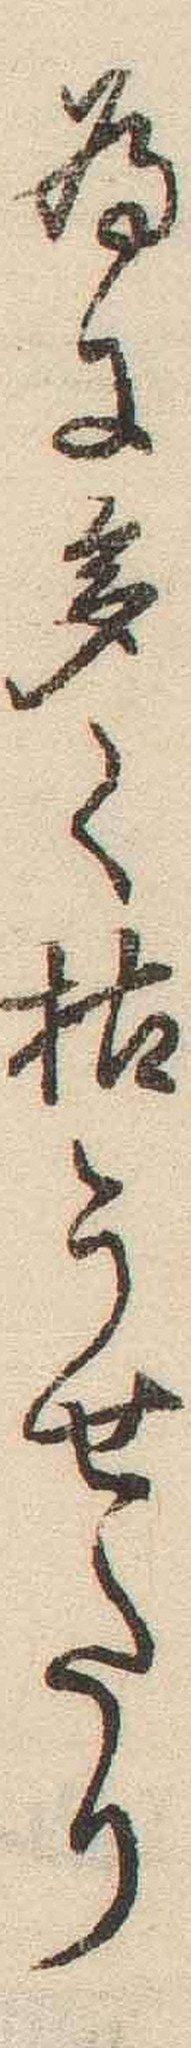為に多く枯うせたり
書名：日光山志
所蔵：東京学芸大学附属図書館 国文学研究資料館
